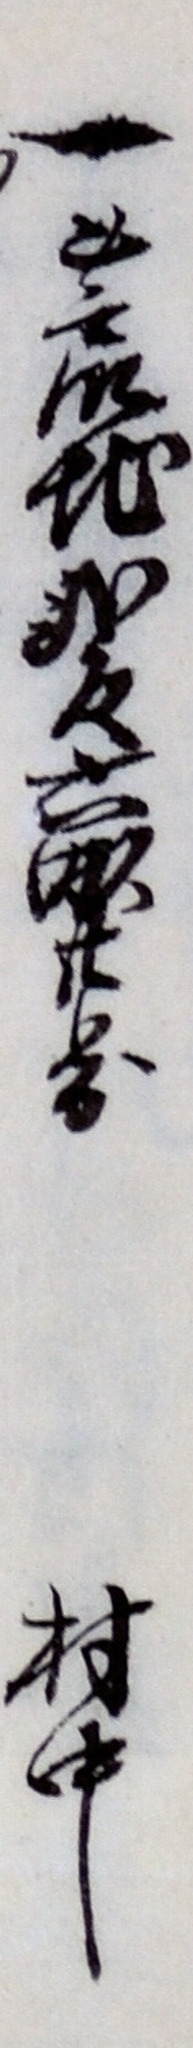一荒地弐反六畝廿歩村中
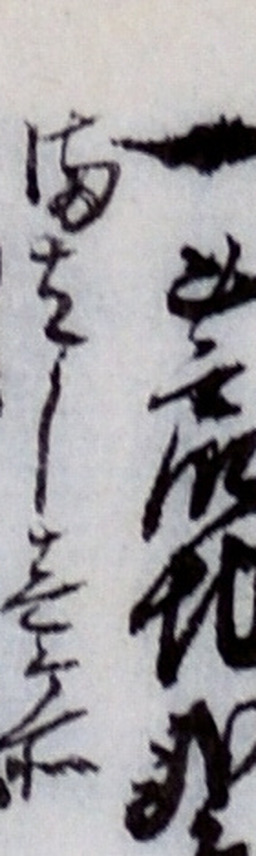まはし壱ケ所
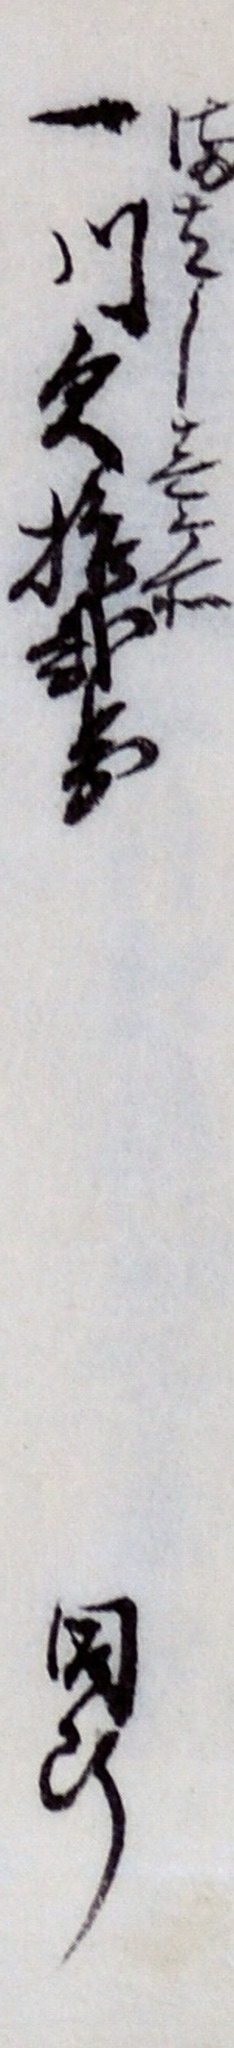一川欠拾弐歩同断
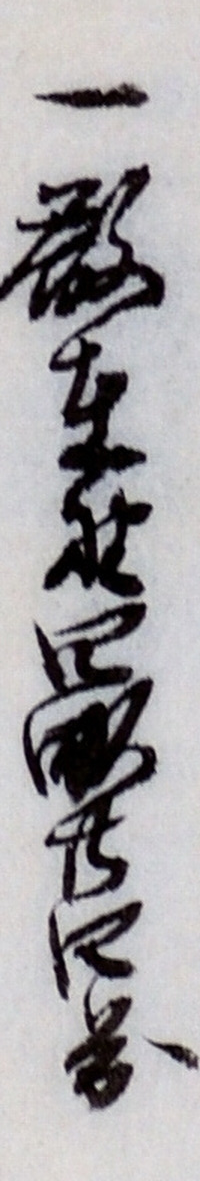一散在野四畝廿四歩
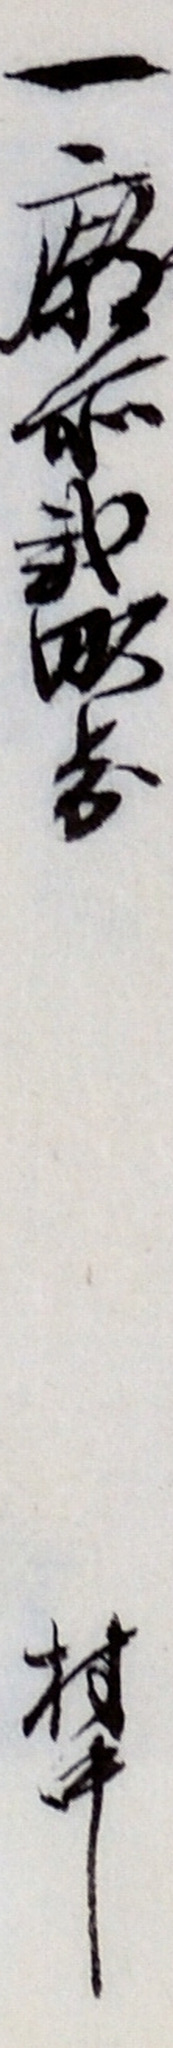一廟所弐畝歩村中
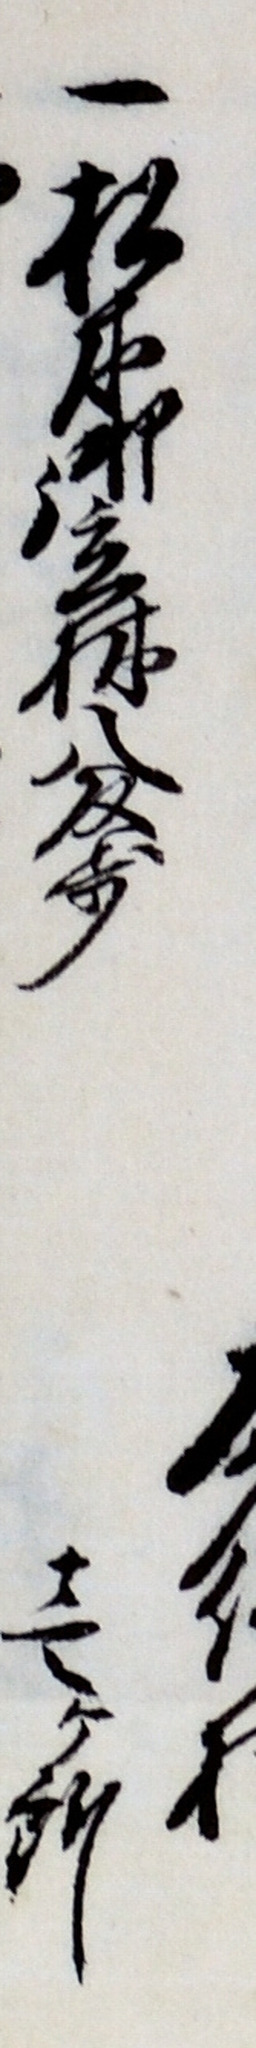一松木御立林八反歩壱ヶ所
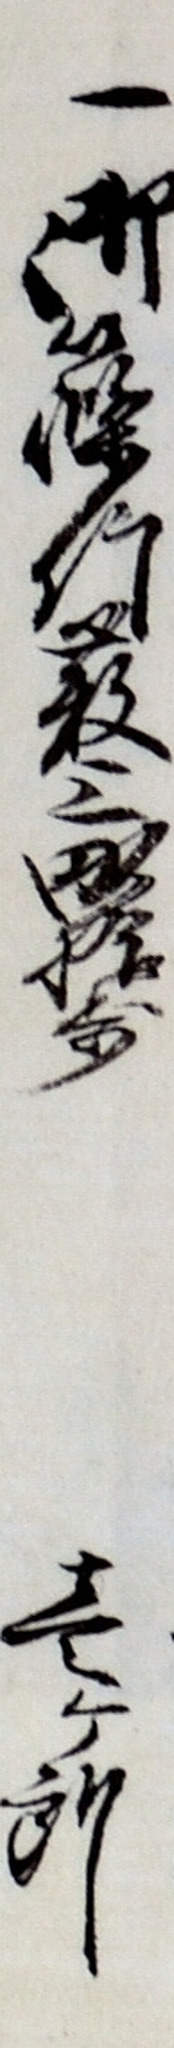一御篠竹藪三畝拾歩壱ヶ所
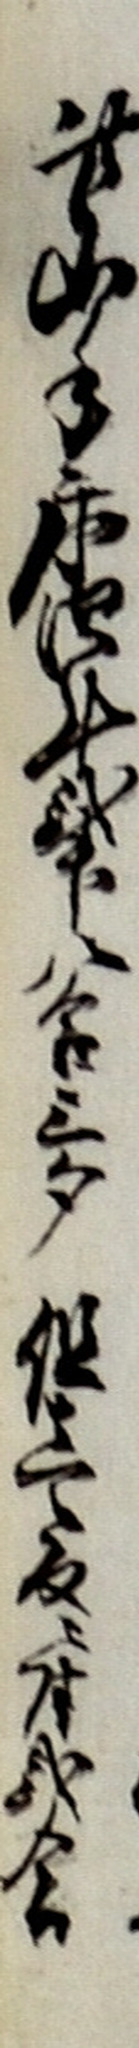此山手米四斗弐升八合三勺但壱反ニ付弐合
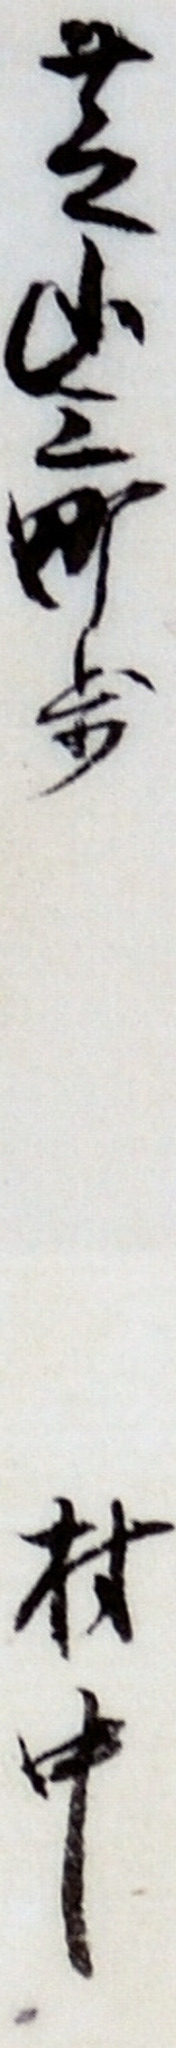芝山三町歩村中
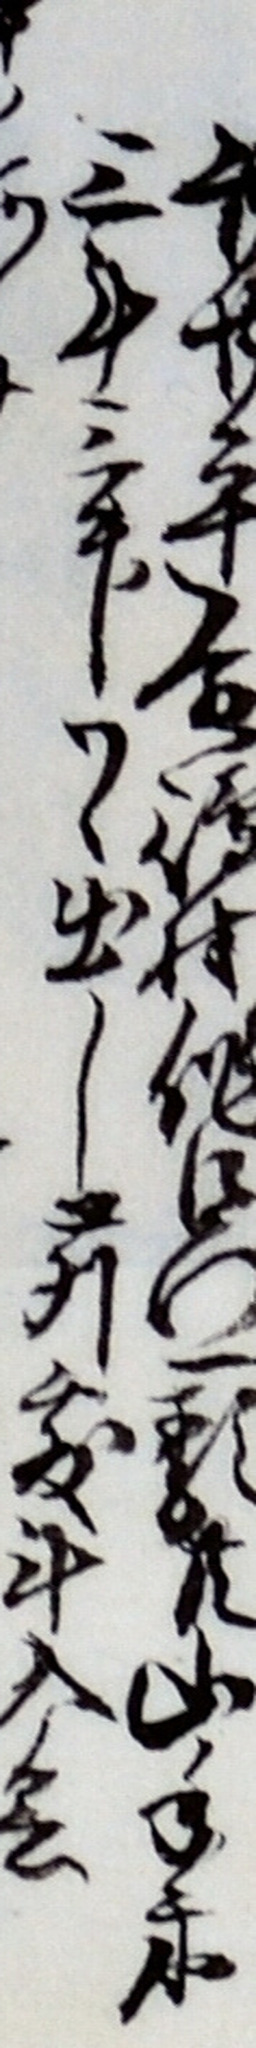三斗三升ツヽ出し苅敷斗入会
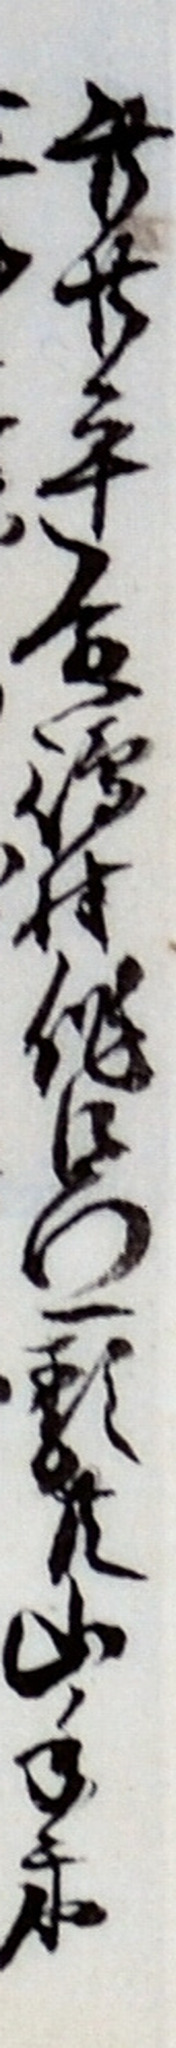此廿平殿島村作左衛門一類共山ノ手米

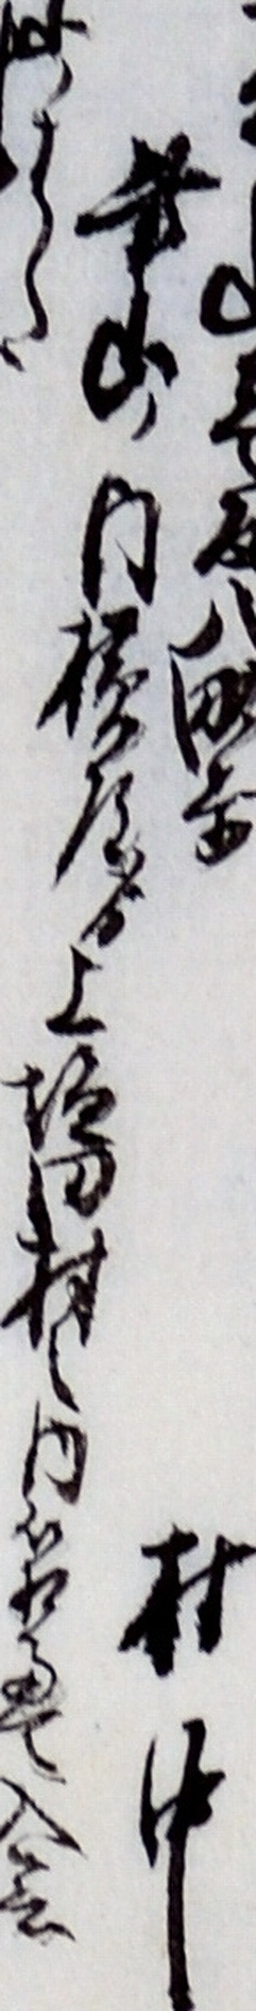此山ノ内横道より上塩田村之内箱畳入会
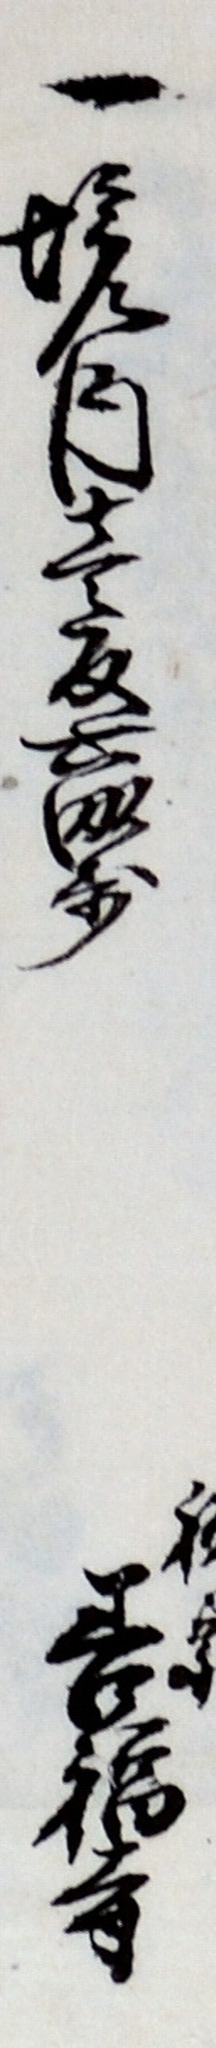一境内壱反六畝歩善福寺
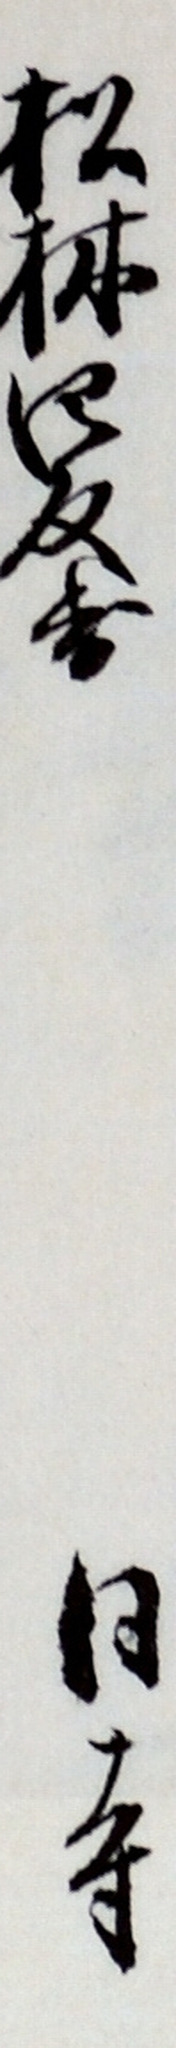松林四反歩同寺
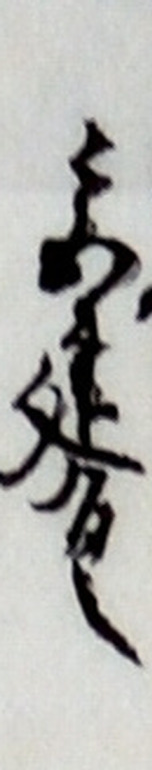宮建有之
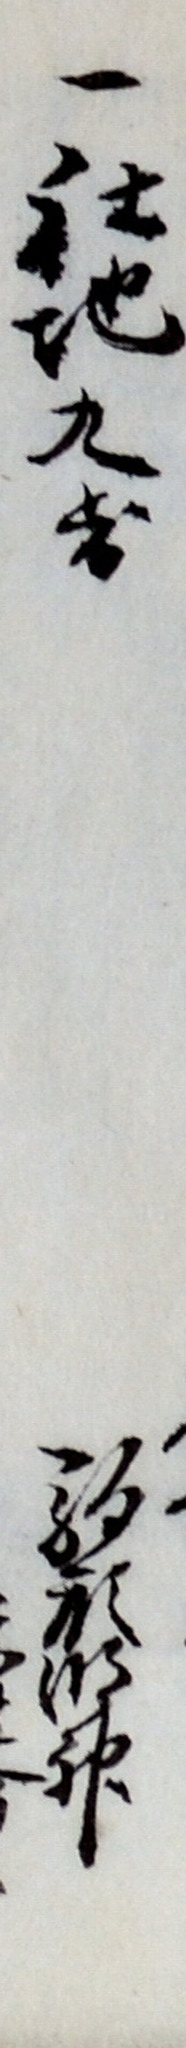一社地九歩駒形明神
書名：御領分中山林社地手控
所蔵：伊那市立高遠町図書館・合同会社AMANE
